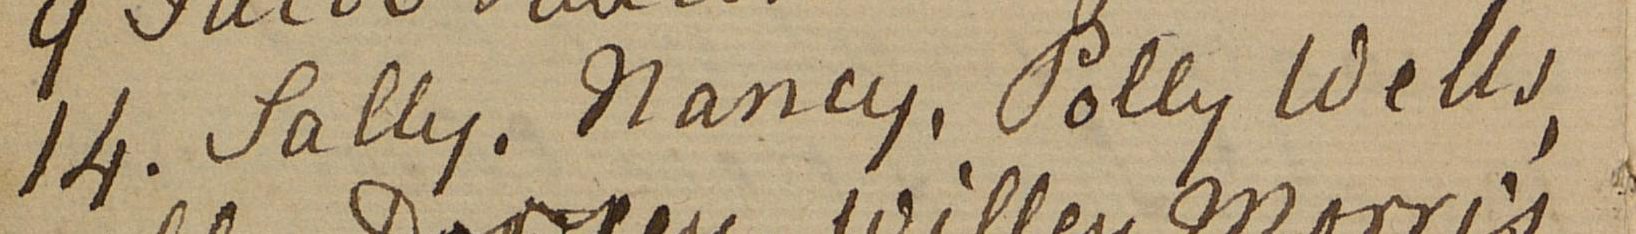14. Sally, Nancy, Polly Wells,
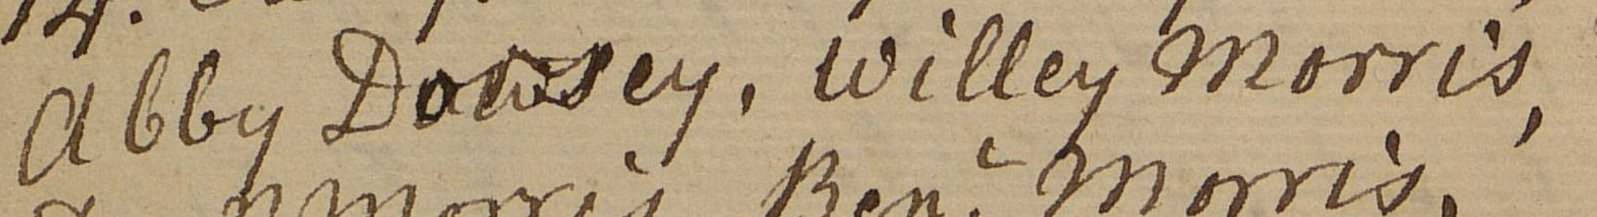Abby Dowsey, Willey Morris,
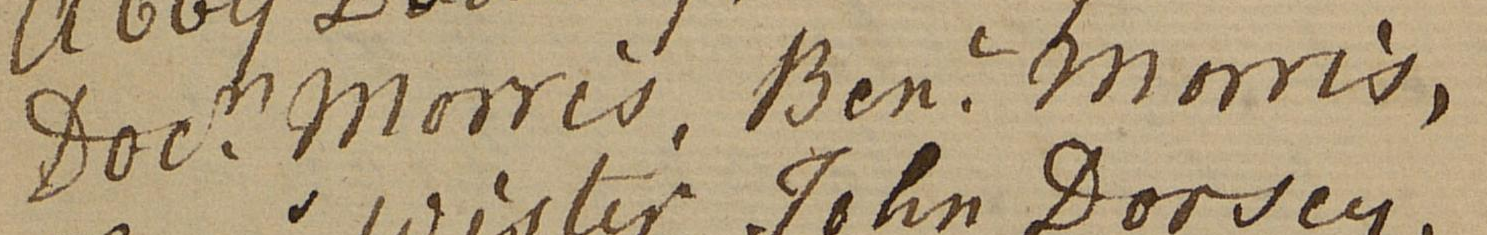Doc^r Morris, Ben^c. Morris.
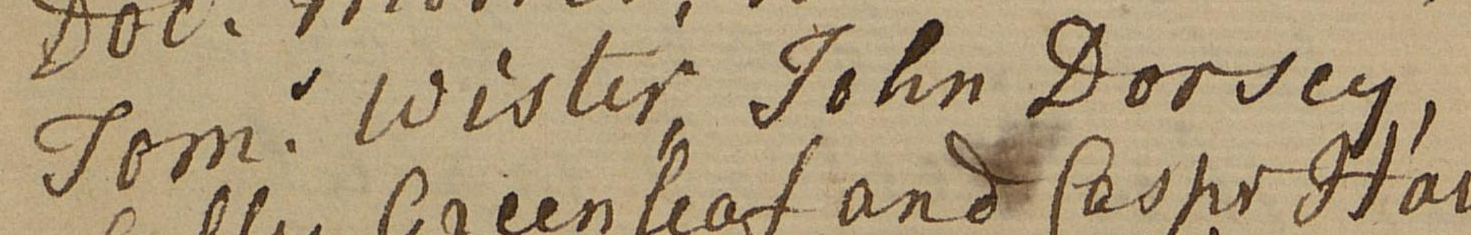Tom^s. Wister, John Dorsey
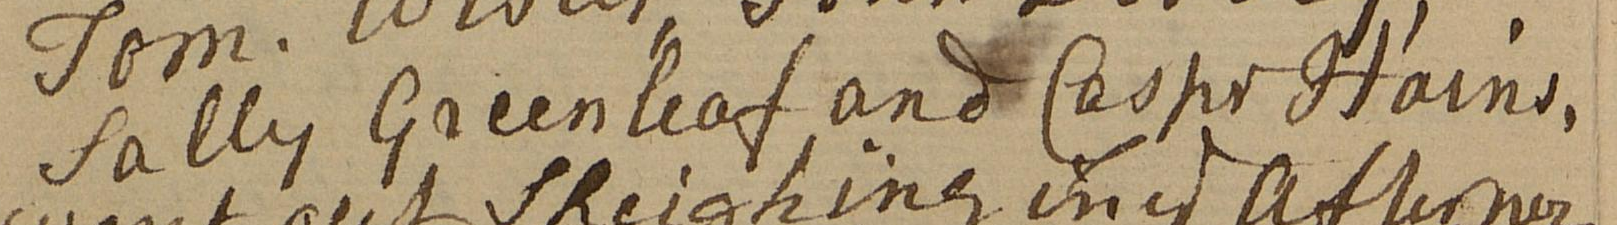Sally Greenleaf and Caspr Hains,
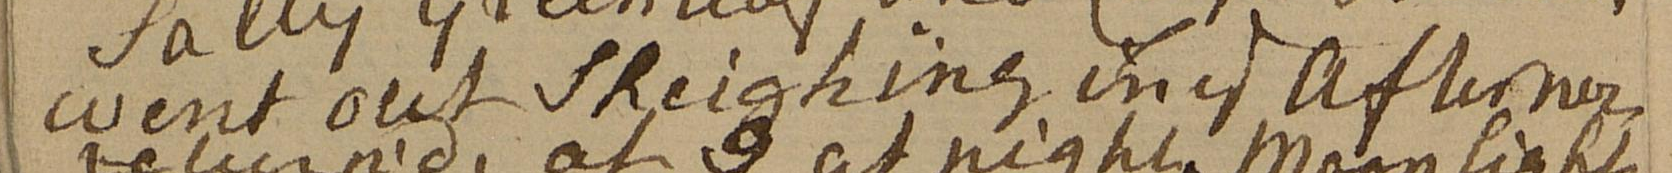went out Sheighing in y^e Afternor
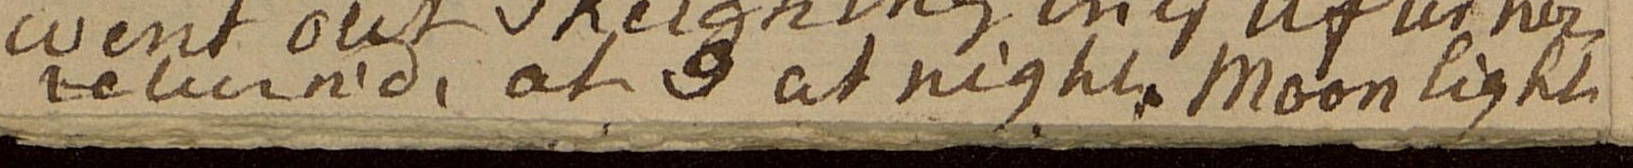return'd at 9 at night, Moon light
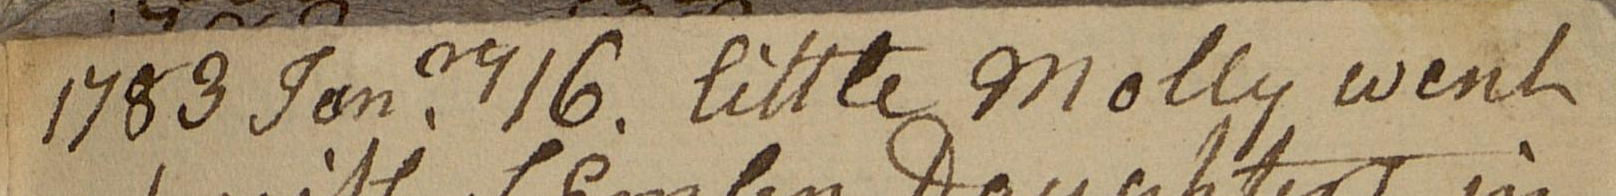1783 Jan^ry 16. little Molly went
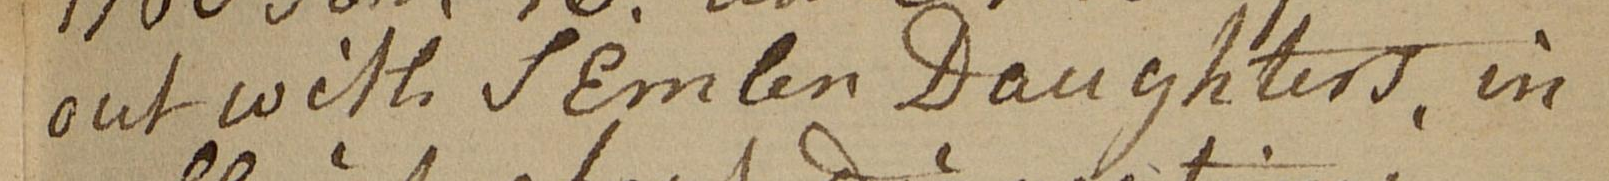out with S Emlen Daughters, in
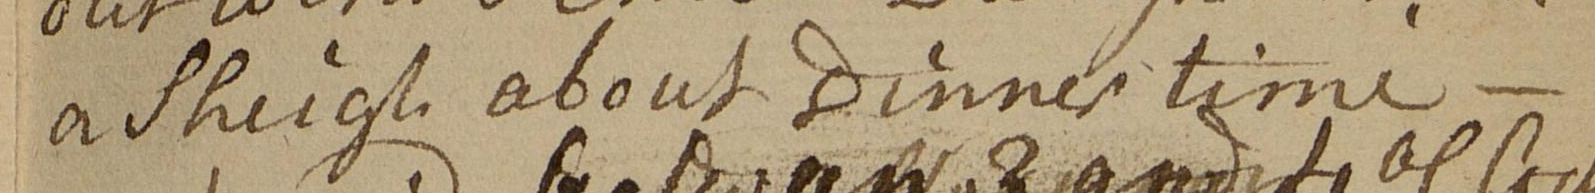a Sheigh about Dinner time-
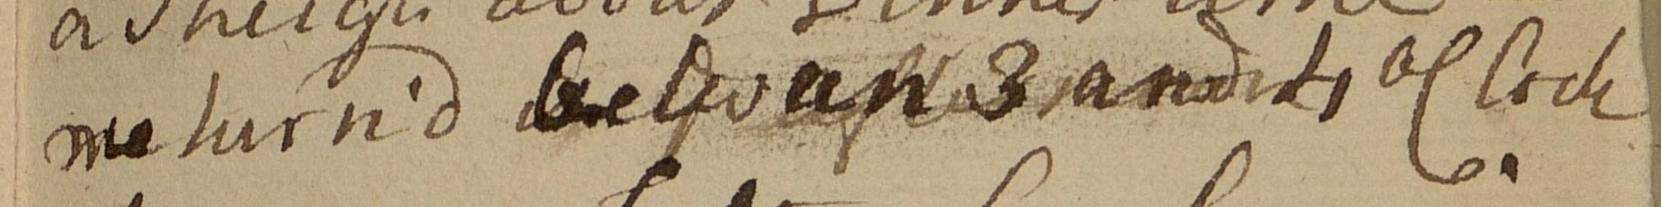return'd between 3 and 4 ^o Clock
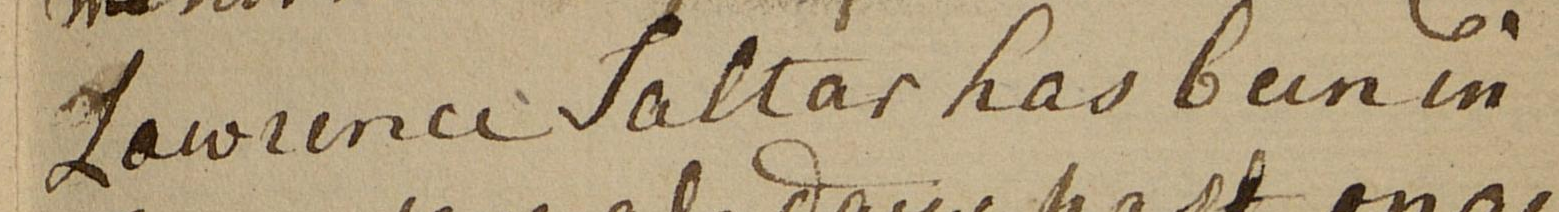Lawrence Saltar has been in
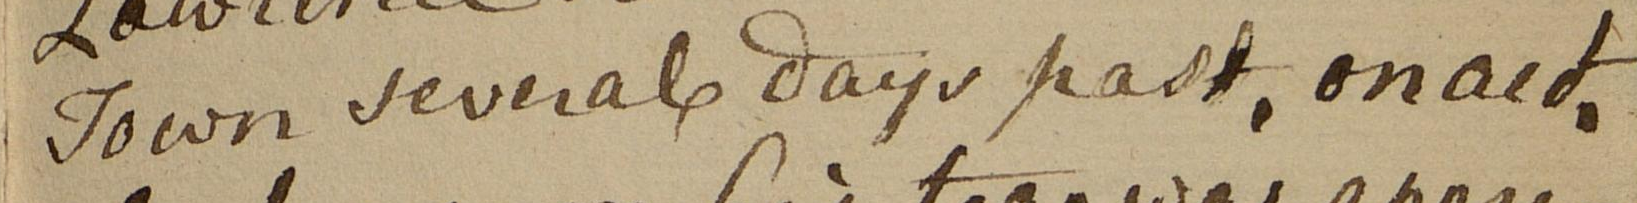Town several days past, on act,
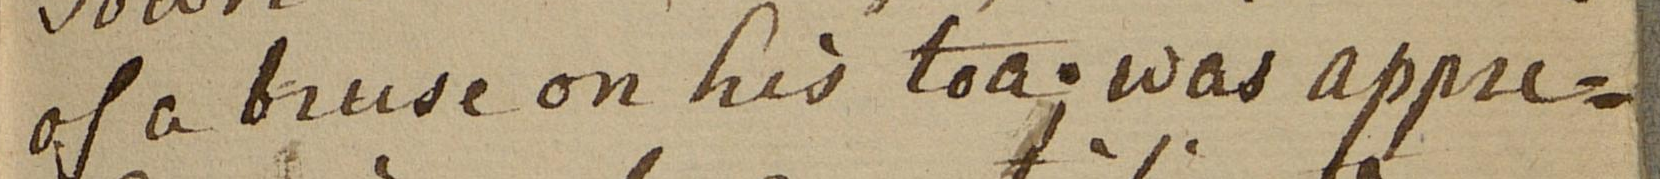of a bruse on his toa. was appre-
